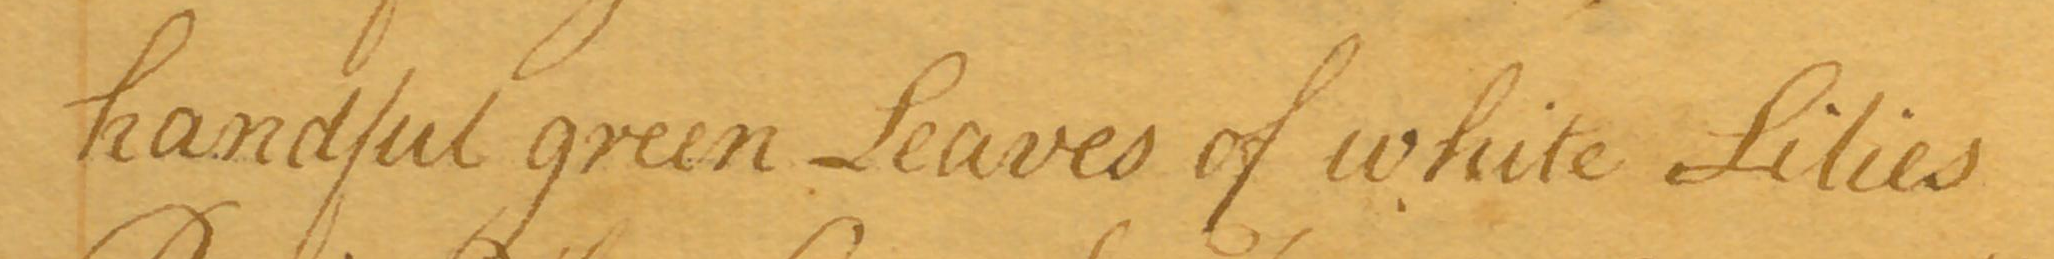handful green Leaves of white Lilies
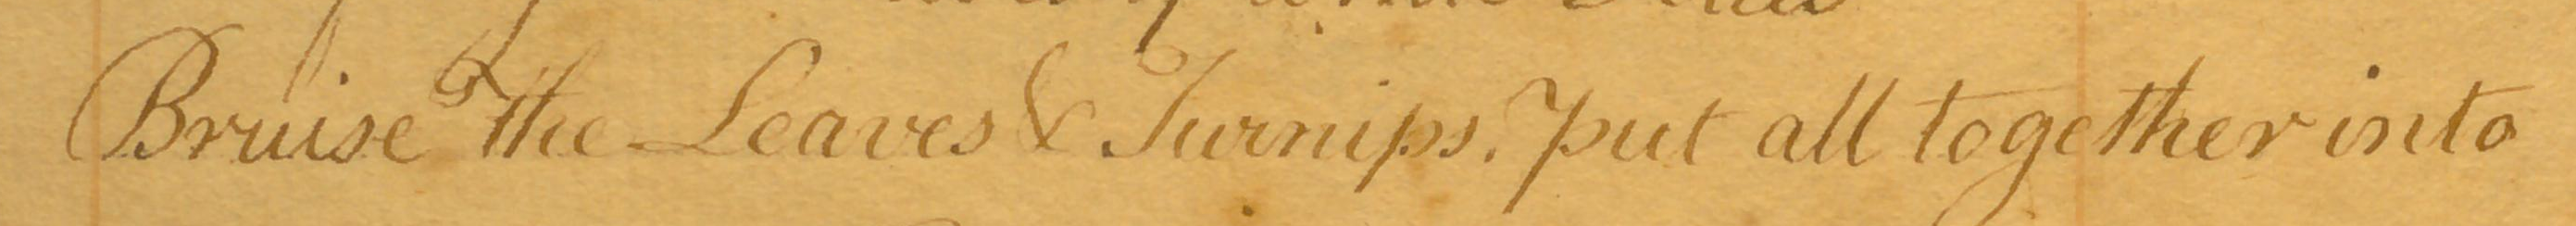Bruise the Leaves & Turnips put all together into
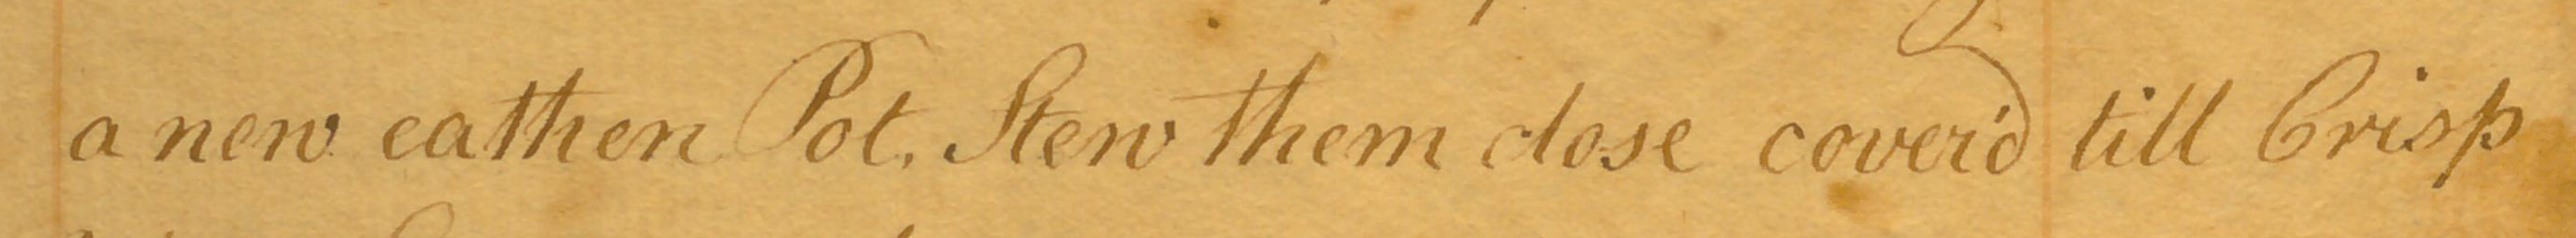a new earthen Pot. Stew them close cover'd till Crisp
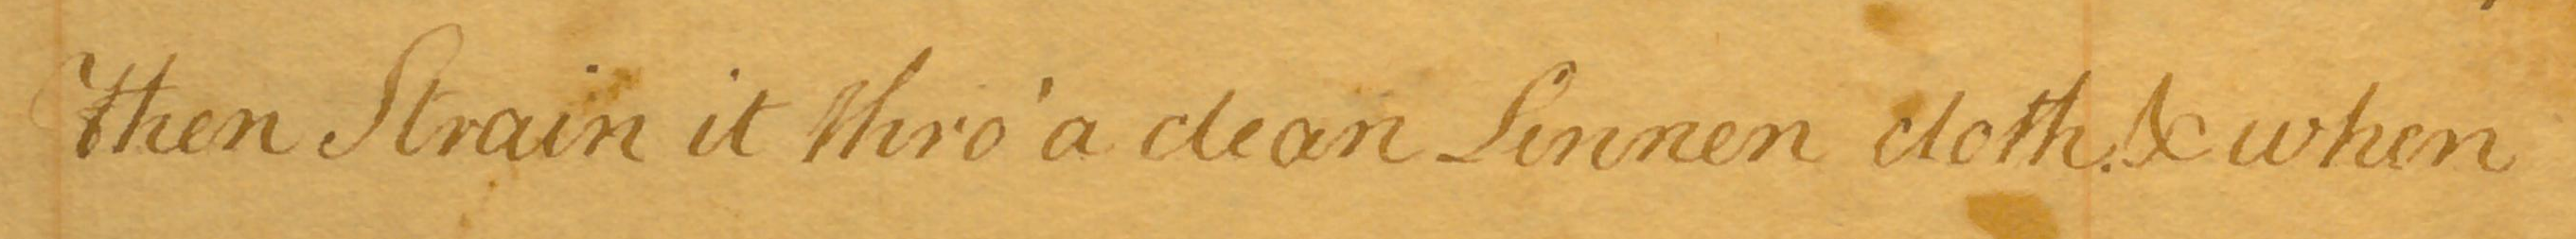then Strain it thro' a clean Linnen cloth & when
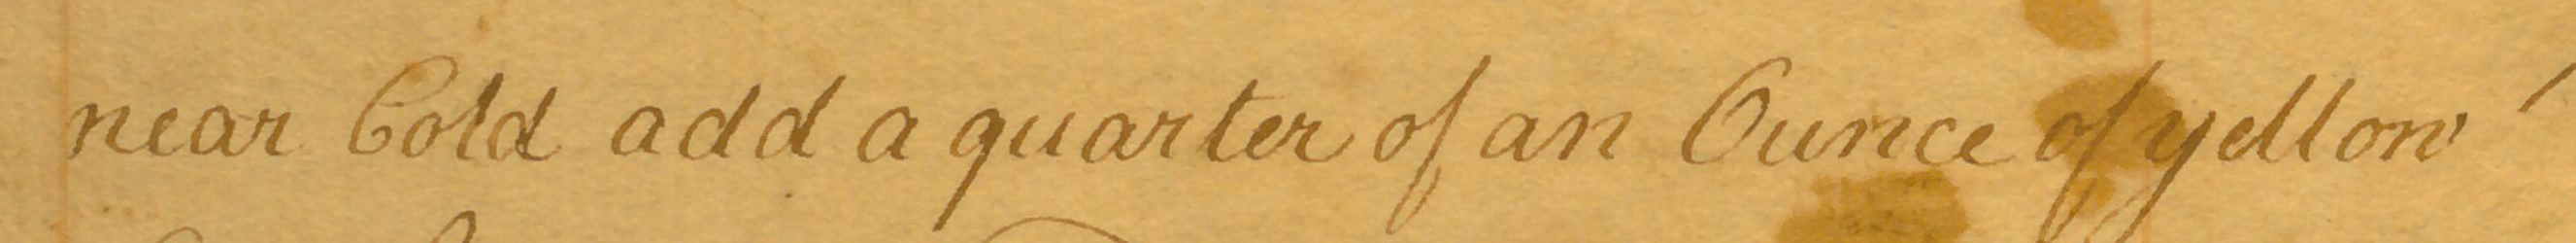near Cold add a quarter of an Ounce of yellow
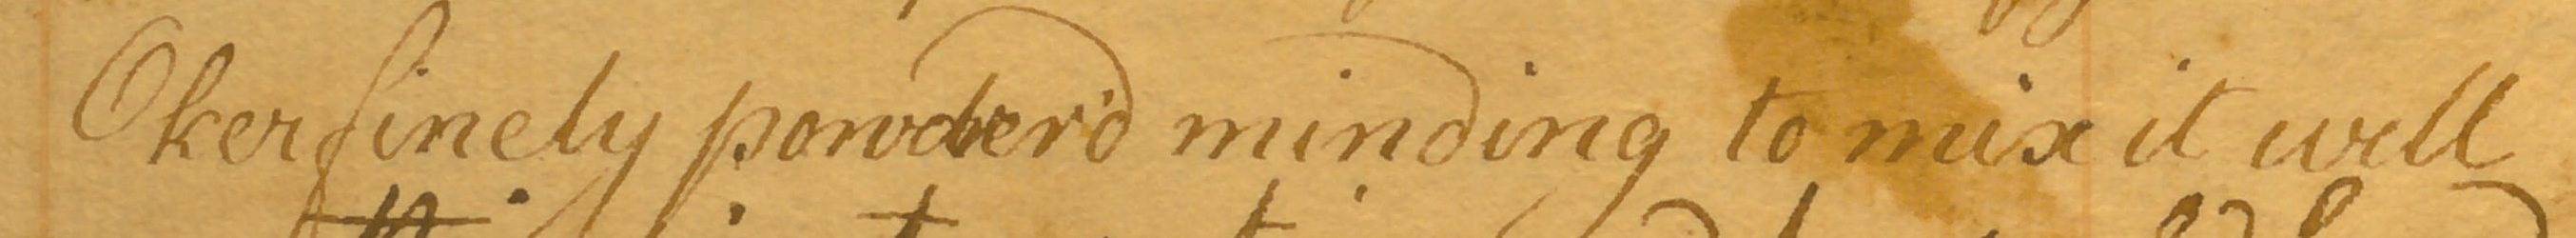Oker finely powder'd minding to mix it well
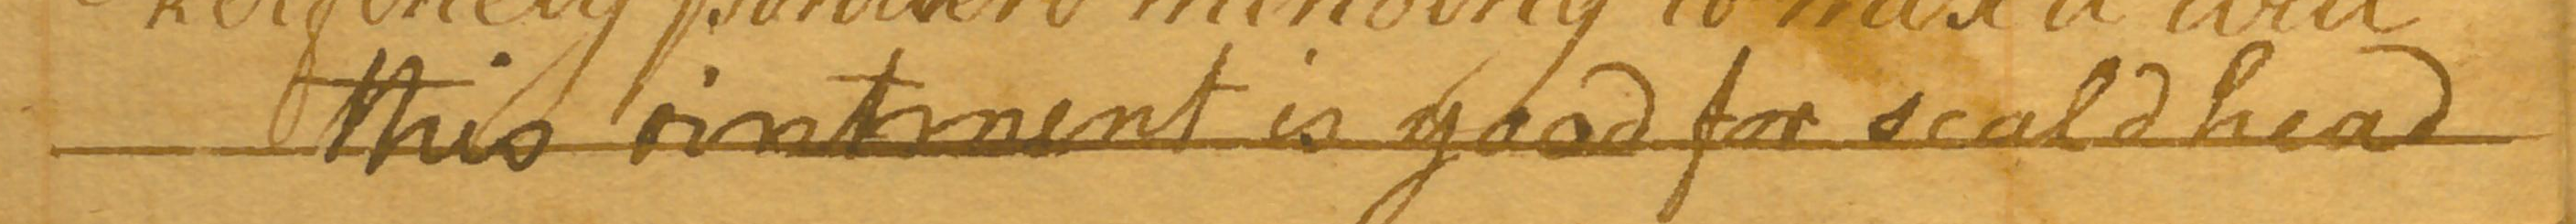this ointment is good for scald head
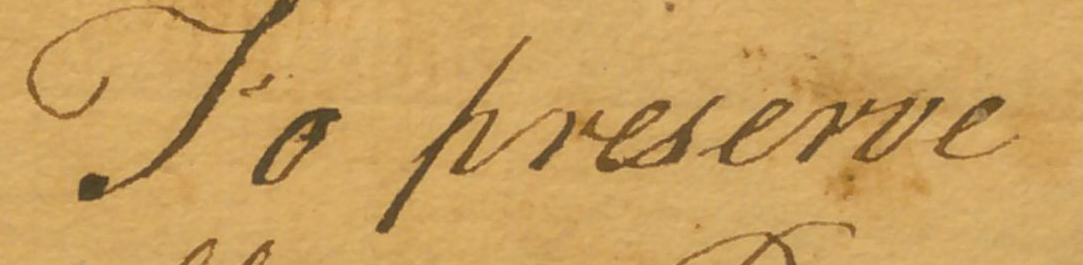To preserve
